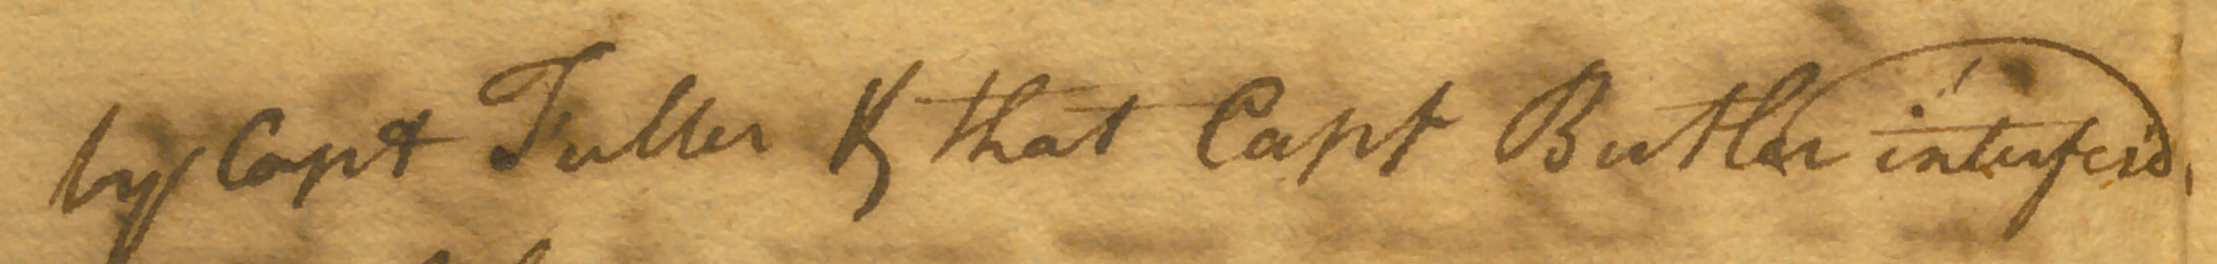by Capt Fuller & that Capt Butler interfer'd,
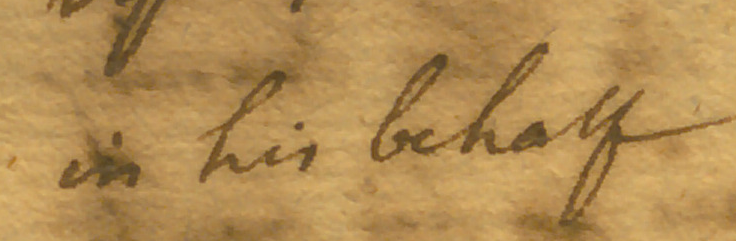in his behalf
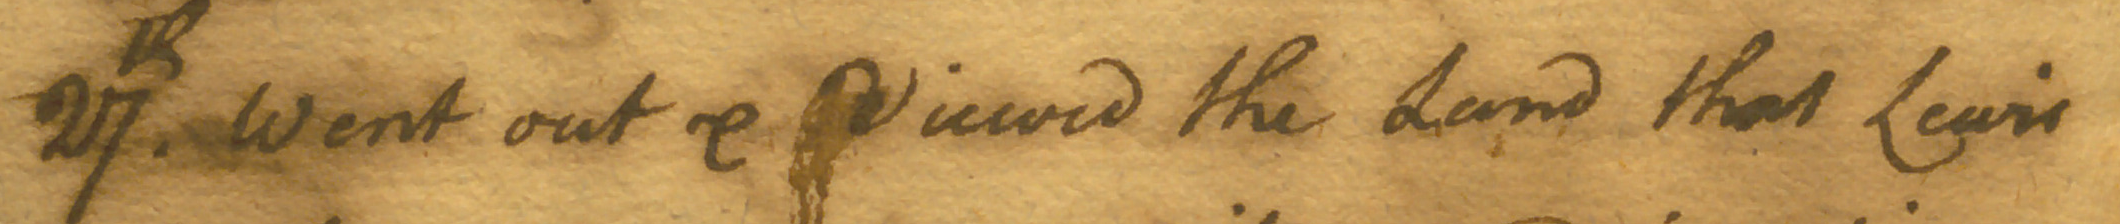27^th. Went out & viewed the Land that Lewis
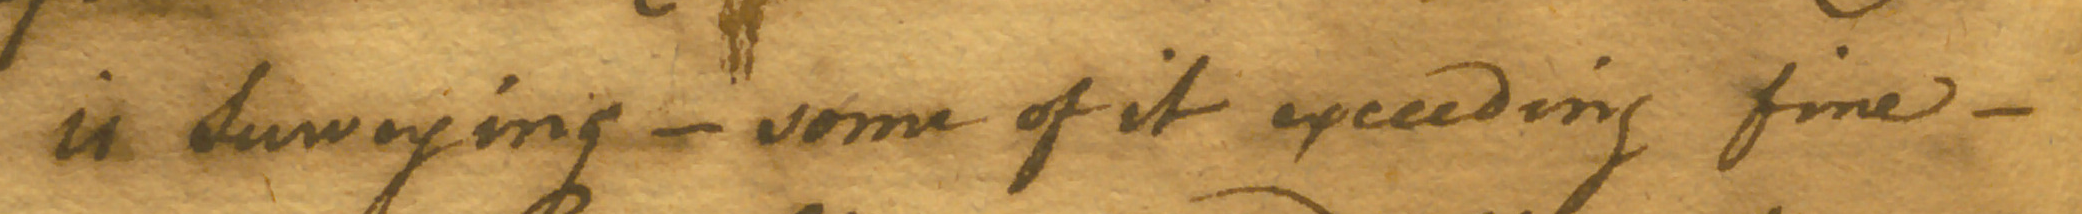is surveying- some of it exceeding fine-
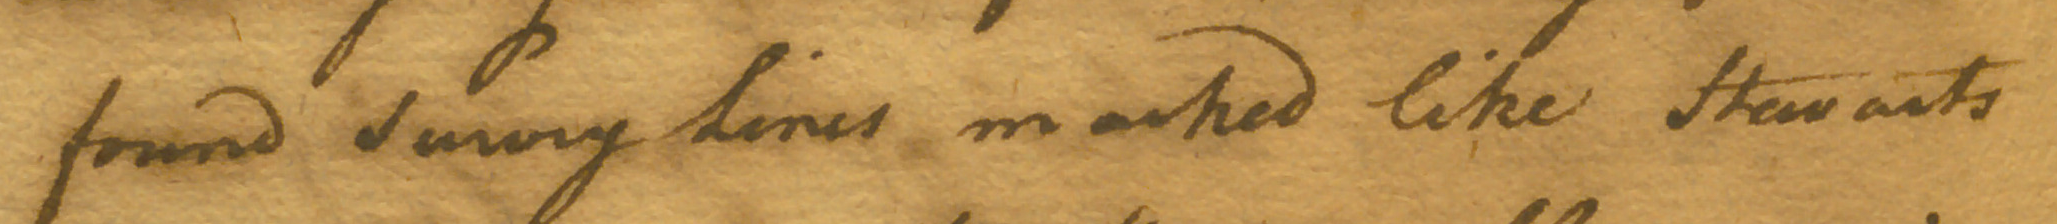found survey Lines marked like Stewarts
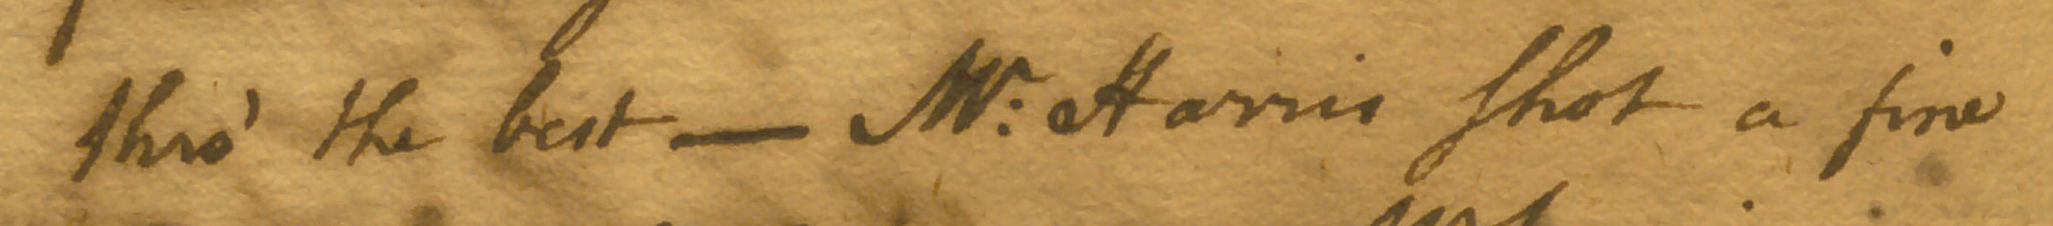thro' the best- M^r: Harris shot a fine
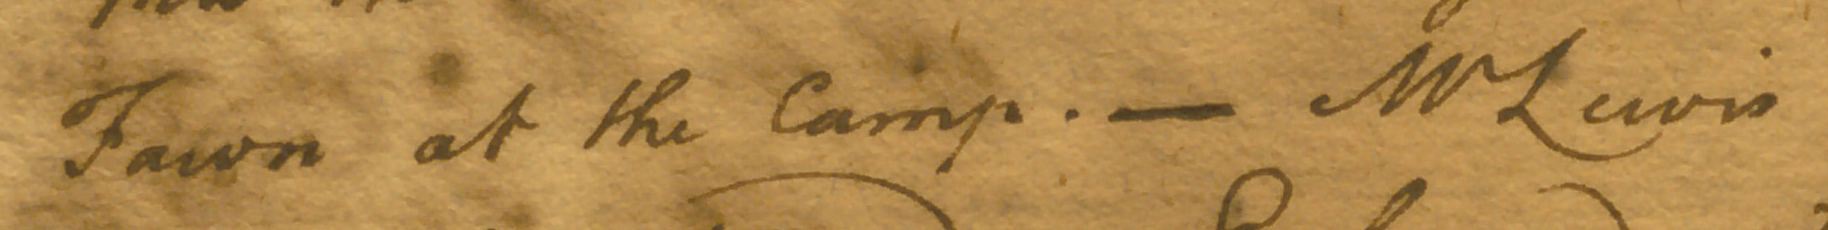Fawn at the Camp.- M^r Lewis
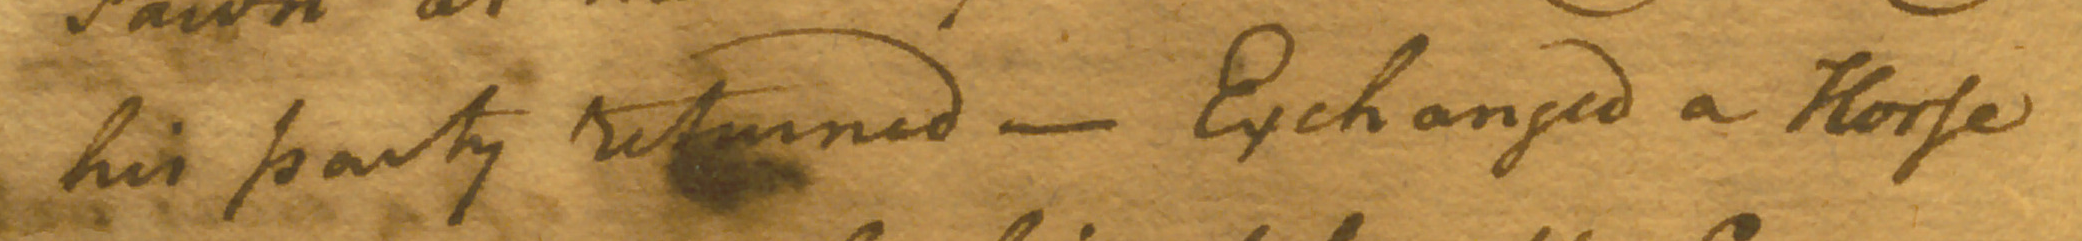his party returned- Exchanged a Horse
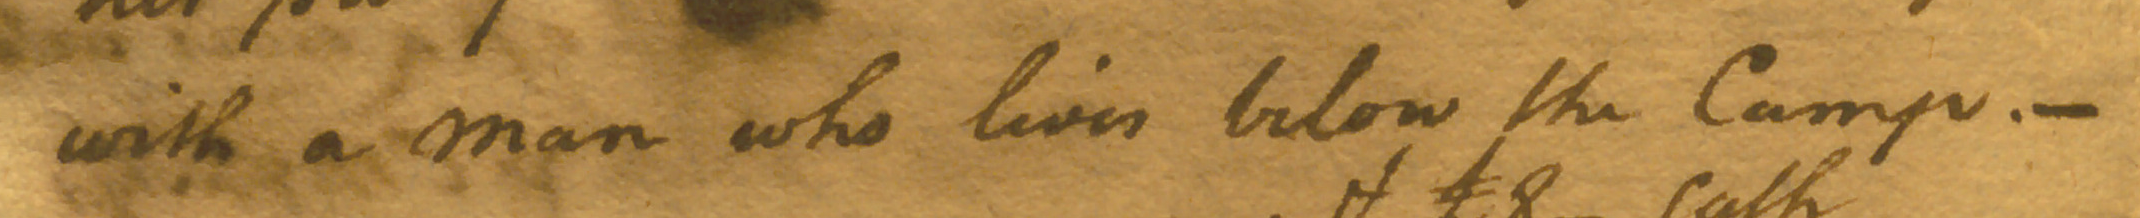with a man who lives below the Camp.-
